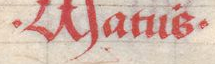.Matuṡ.
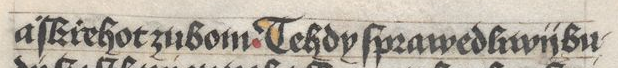a ẛkṙehot zubom.Tehdy ſprawedliwij bu¬
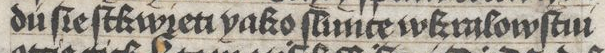dú ſie ſtkwíeti yako ſlunce wkralowſtuí
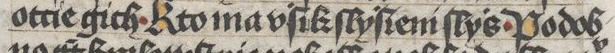otcie gich.Kto ma vẛi kſlyẛieni ſlyṡ.Podob¬
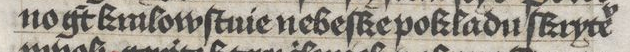no ḡt kralowſtuie nebeſke pokladu ſkrytev
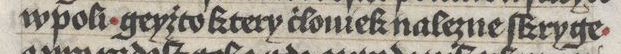wpoli.geyżto ktery ċlowiek nalezne ſkryge.
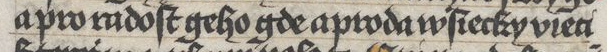a pro radoſt geho gde a proda wẛiecky vieci
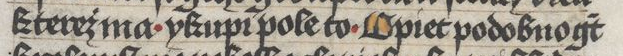ktereż ma.ykupí pole to.Opiet podobno ḡt
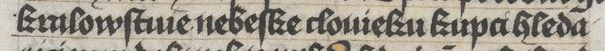kralowſtuie nebeſke clouieku kupci hleda¬
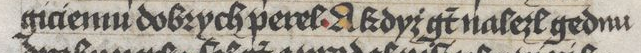gicíemu dobrych perel.A kdyż ḡt nalezl gednu
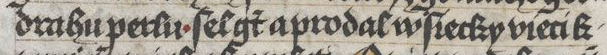drahu petlu.ſel ḡt a prodal wẛiecky viecí k¬
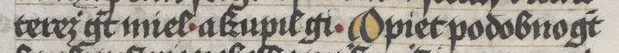tereż ḡt miel.a kupil gi.Opiet podobno ḡt
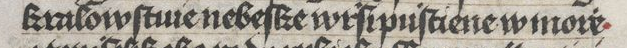kralowſtuíe nebeſke wrẛi puẛtiene w moṙe.
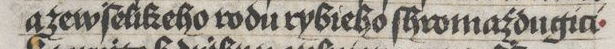a zewẛelikeho rodu rybieho ſhromażdugící.
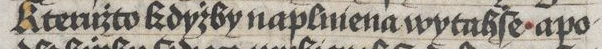Kterużto kdyżby naplniena wytahẛe.a po¬
